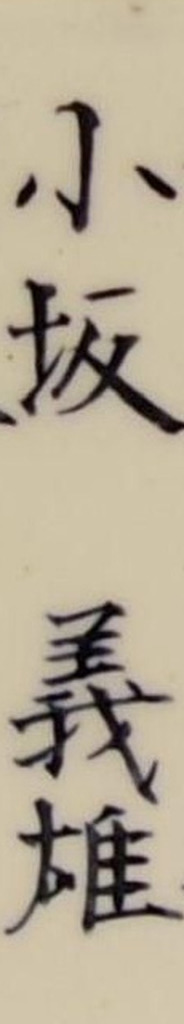小坂義雄
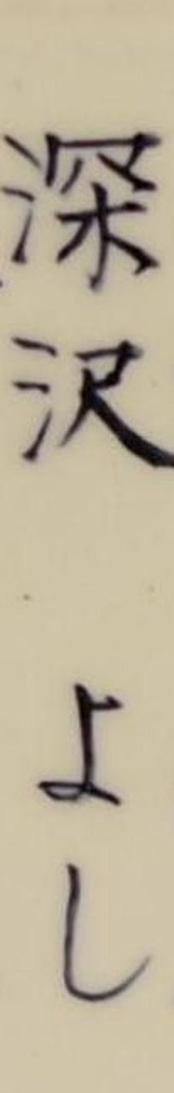深沢よし
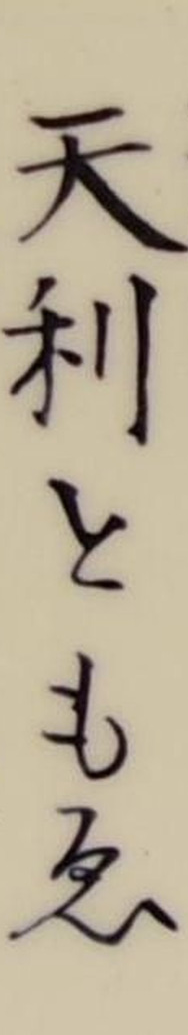天利ともゑ
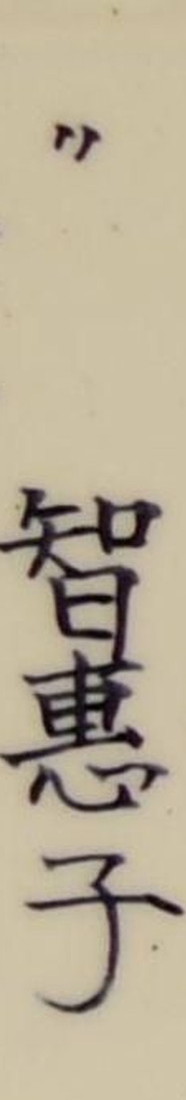智恵子
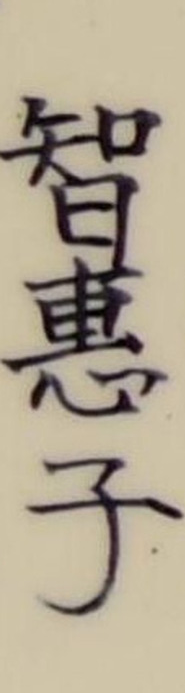智恵子
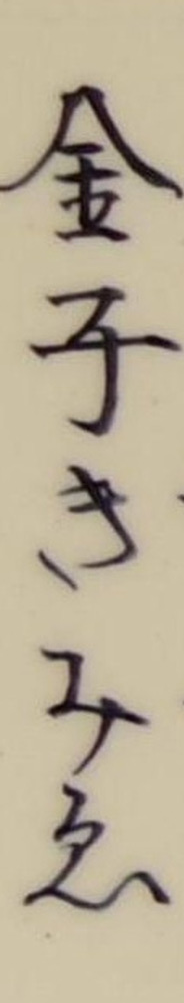金子きみゑ
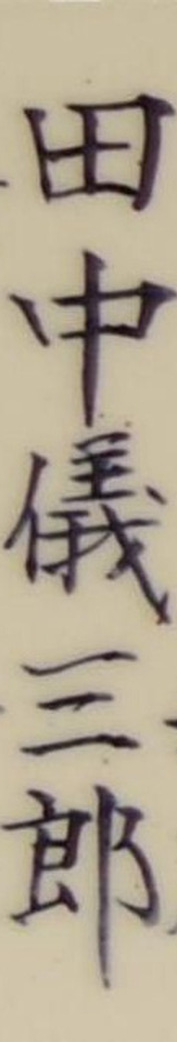田中儀三郎
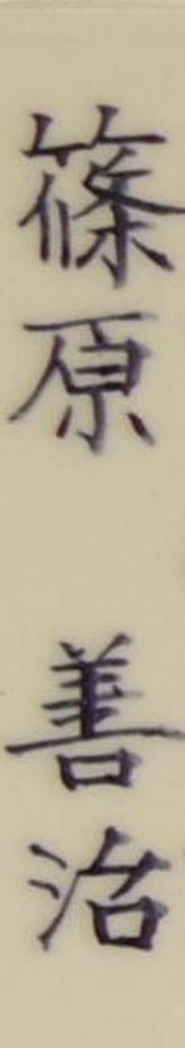篠原善治

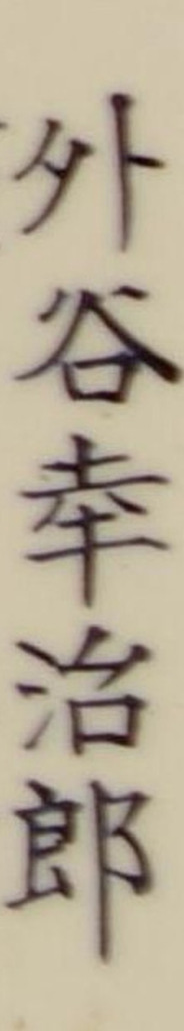外谷幸治郎
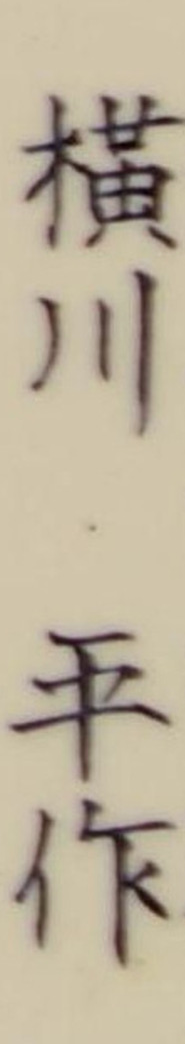横川平作
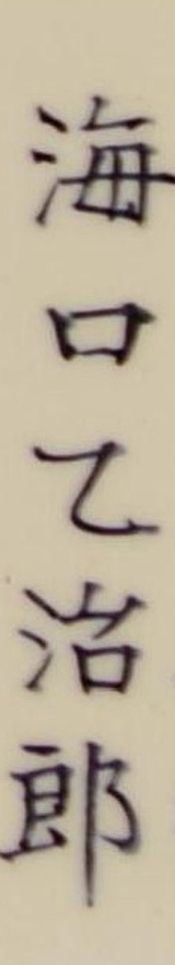海口乙治郎
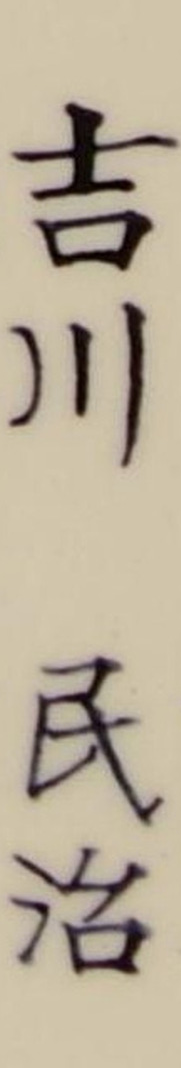吉川民治
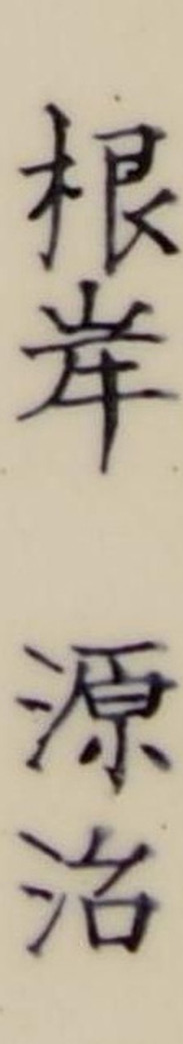根岸源治
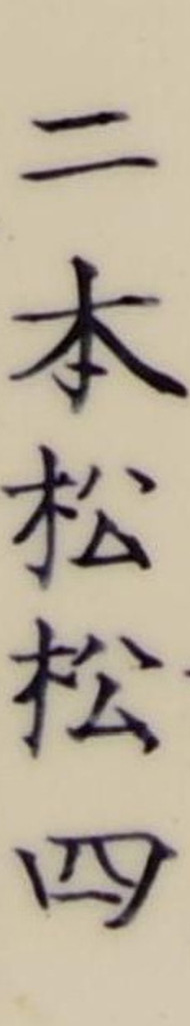二本松松四
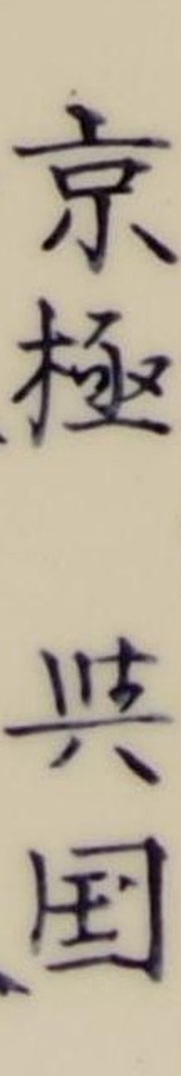京極与国
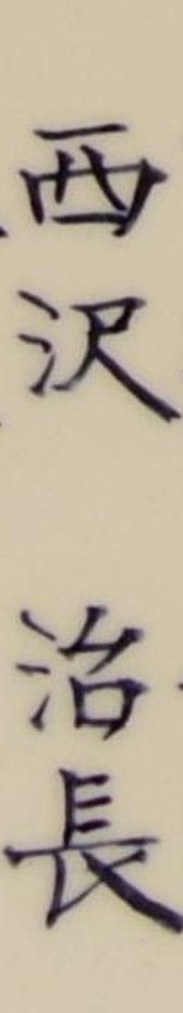西沢治長
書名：A~D
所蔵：koyasan kongobuji
